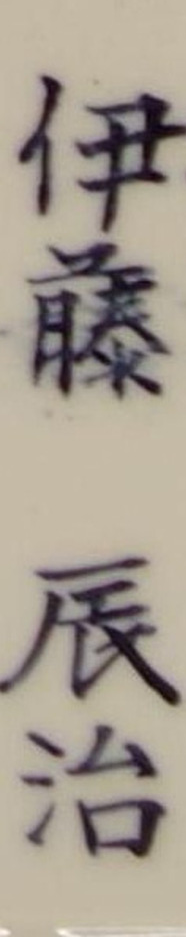伊藤辰治
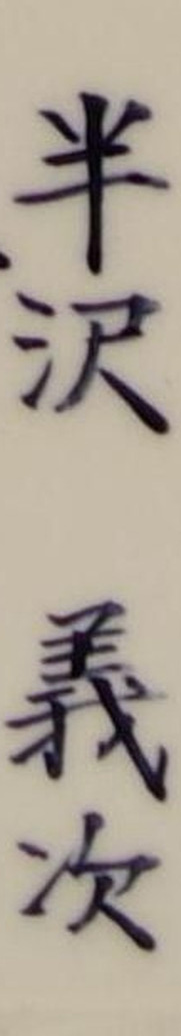半沢義次
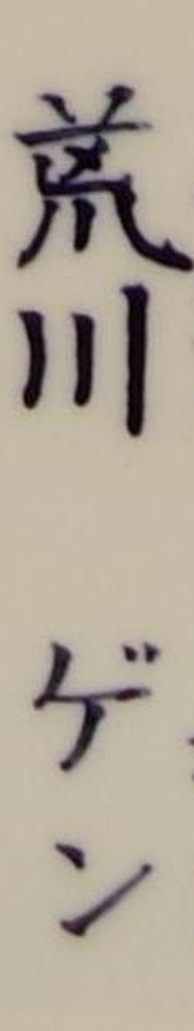荒川ゲン
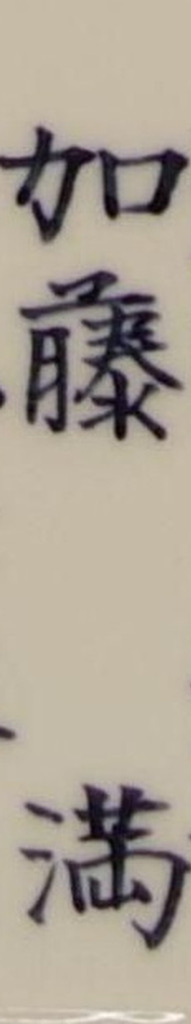加藤満
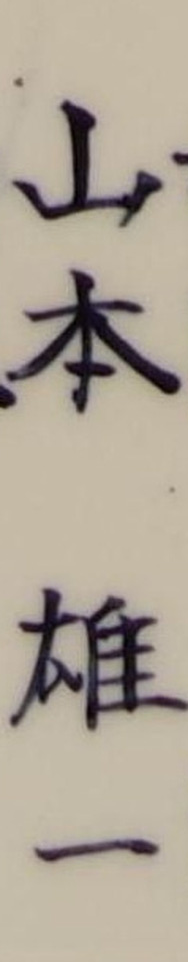山本雄一
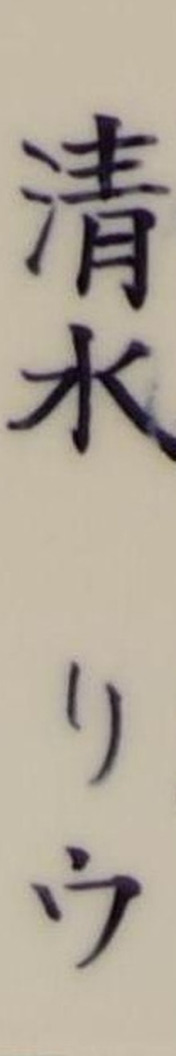清水リウ
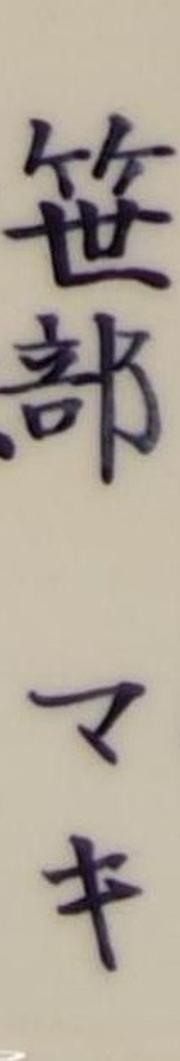笹部マキ
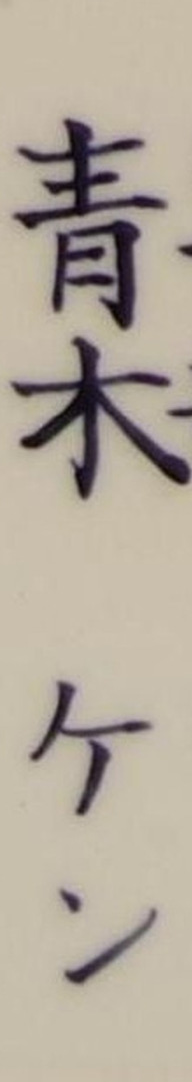青木ケン
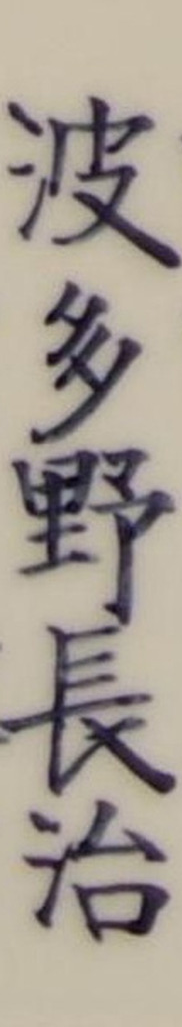波多野長治
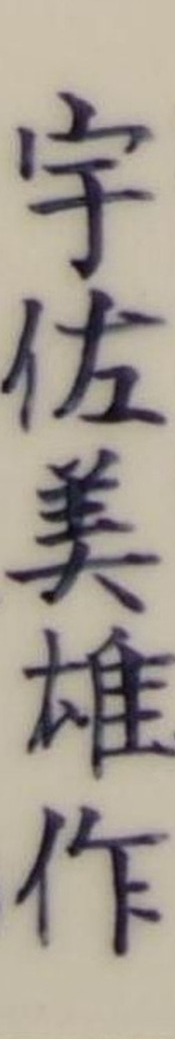宇佐美雄作
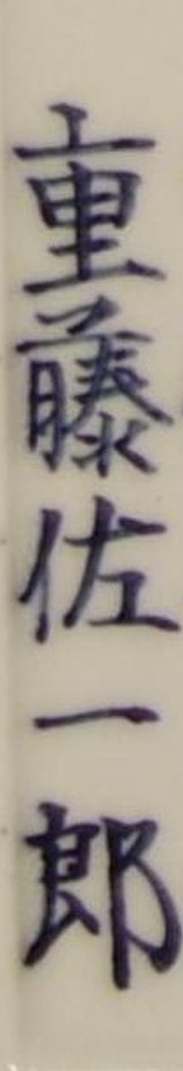重藤佐一郎

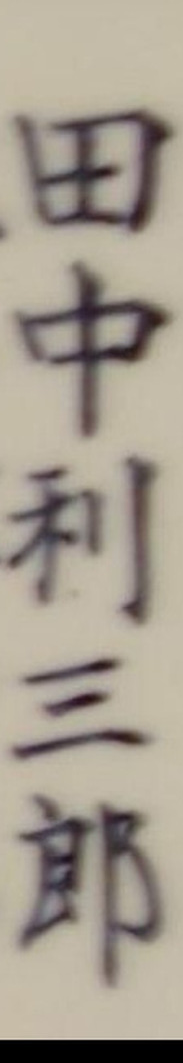田中利三郎
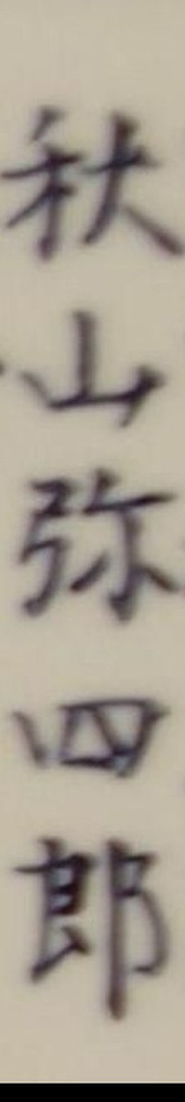秋山弥四郎
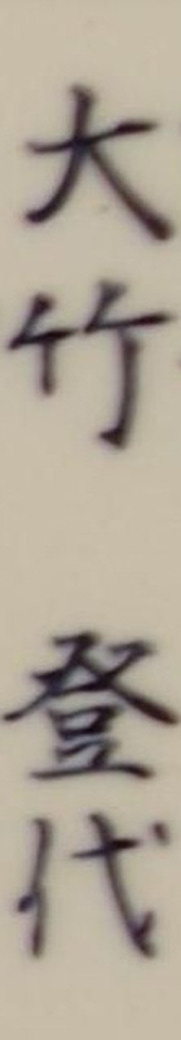大竹登代
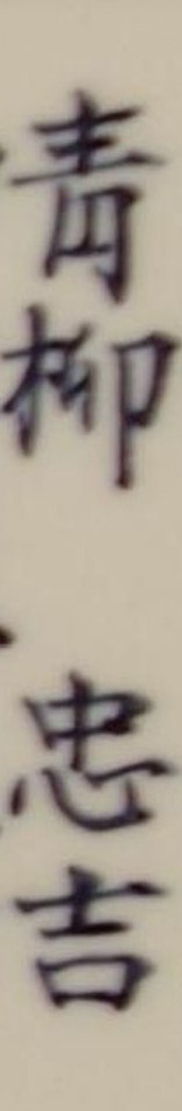青柳忠吉
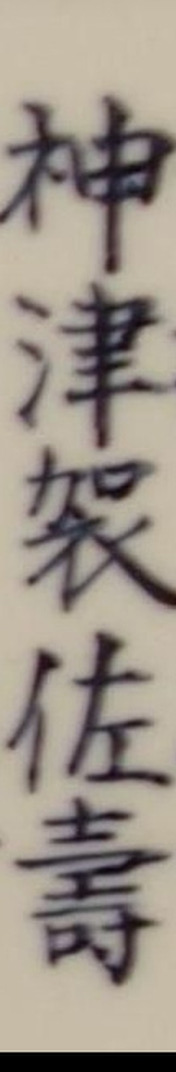神津袈佐壽
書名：M~S
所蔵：高野山金剛峯寺
